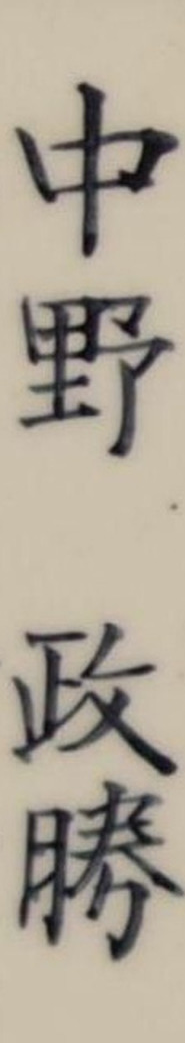中野政勝
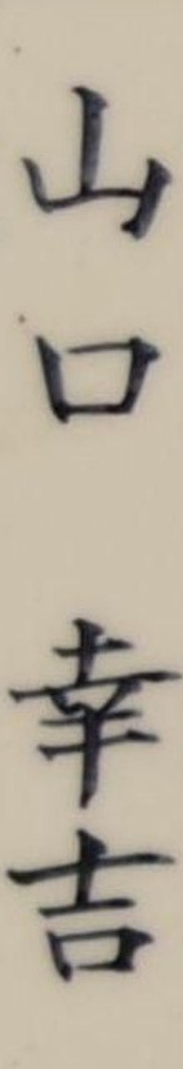山口幸吉
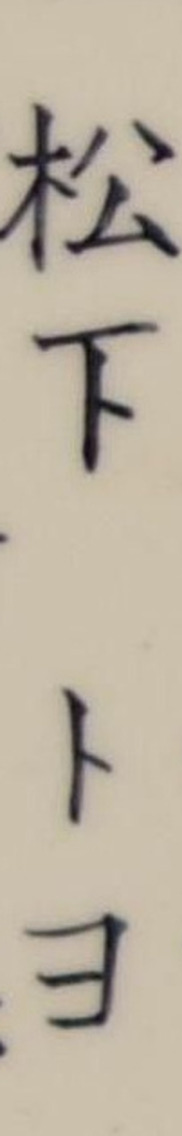松下トヨ
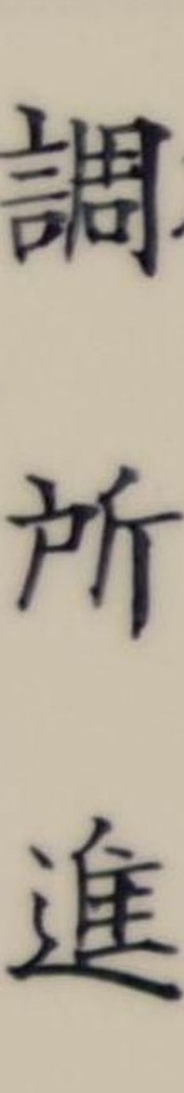調所進
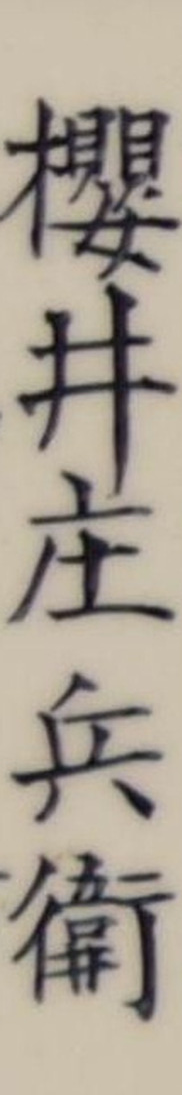桜井庄兵衛
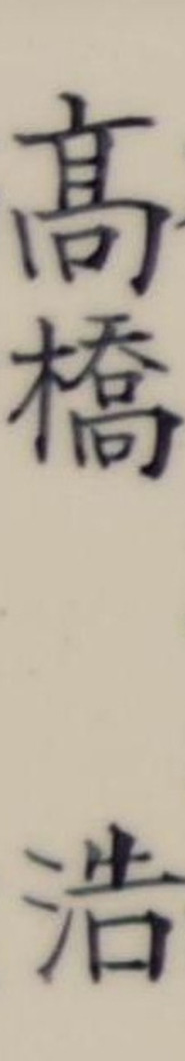高橋浩
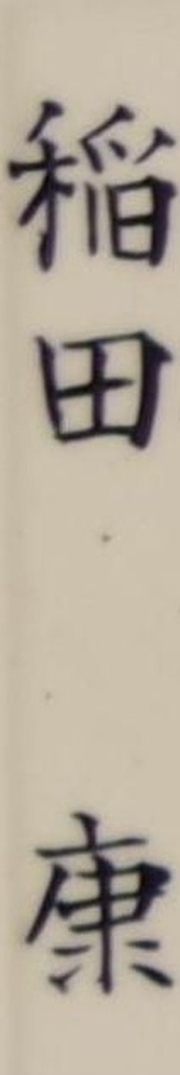稲田康

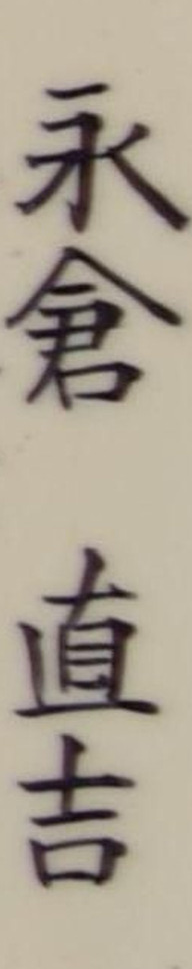永倉直吉
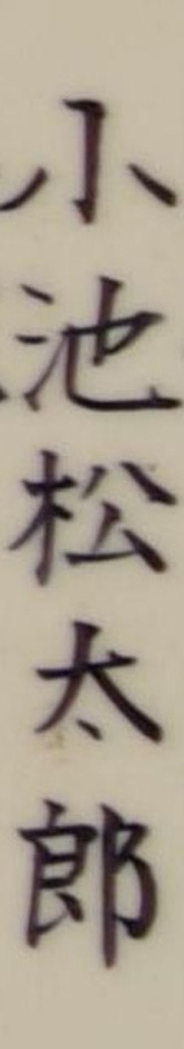小池松太郎
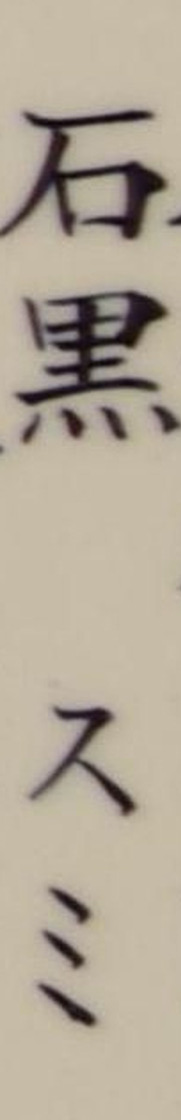石黒スミ
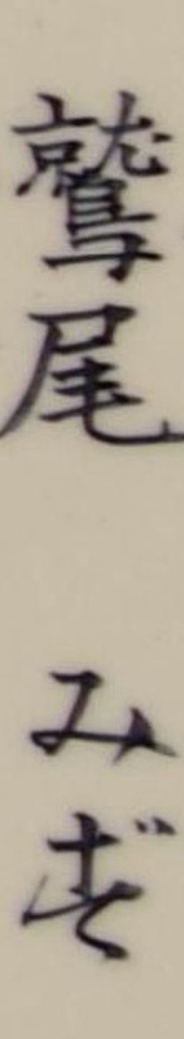鷲尾みず
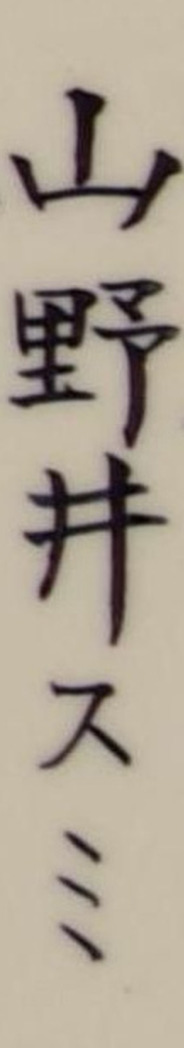山野井スミ
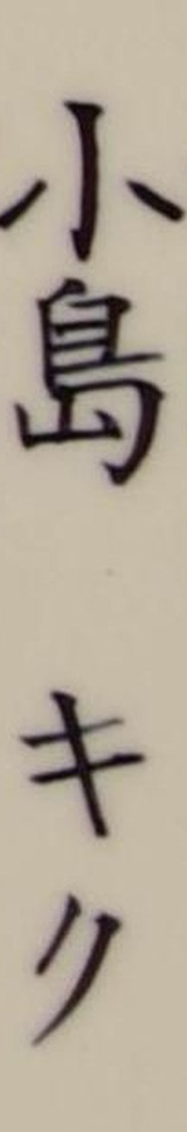小島キク
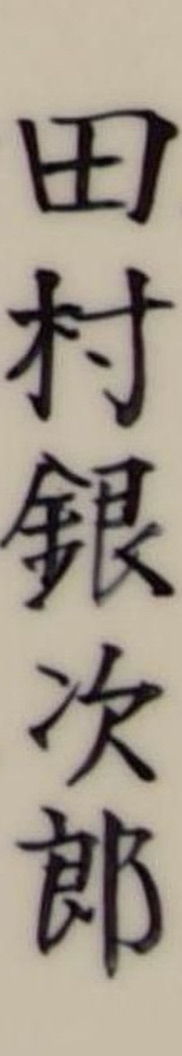田村銀次郎
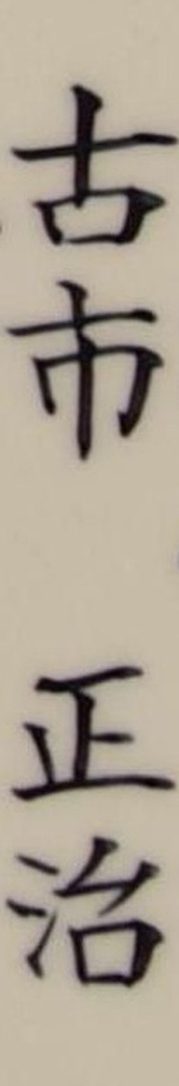古市正治
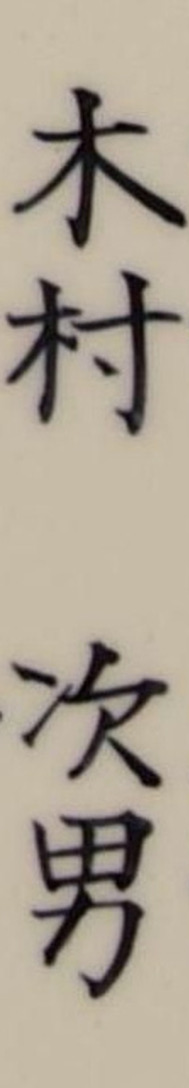木村次男
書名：M~S
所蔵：高野山金剛峯寺
